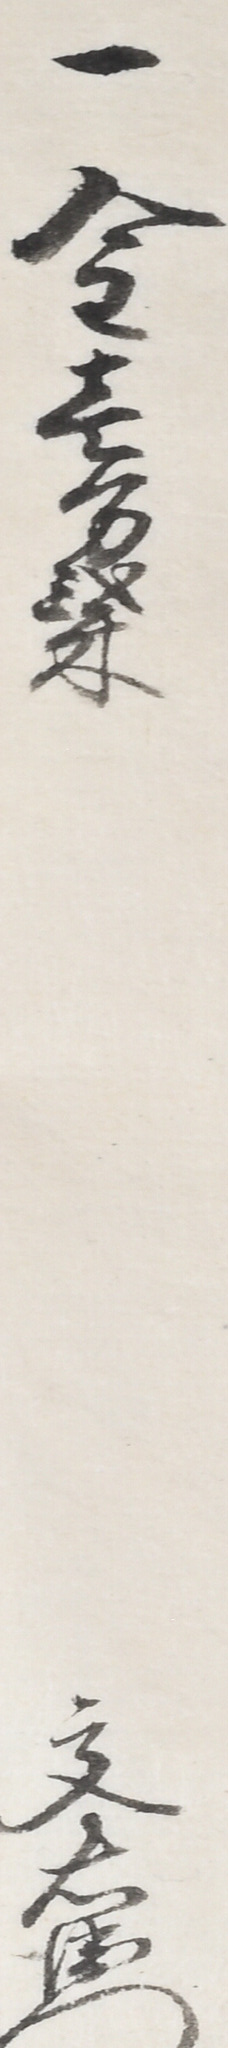一金壱分弐朱文右衛門
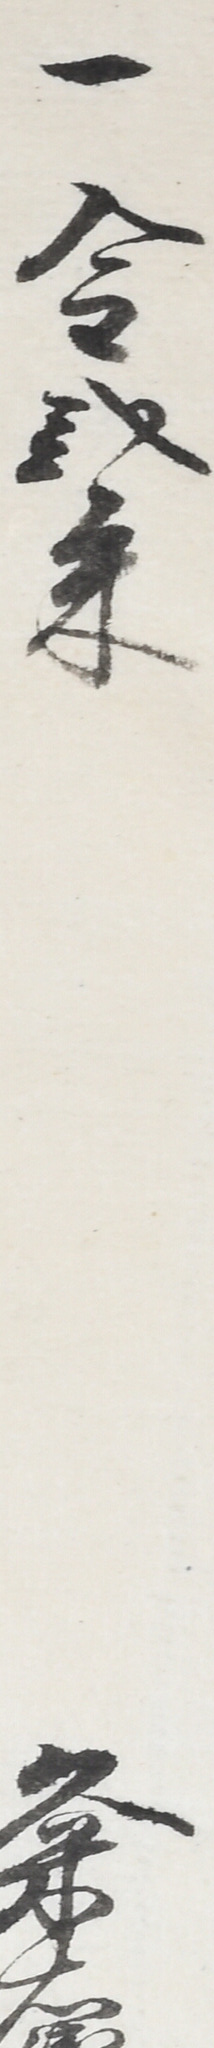一金弐朱粂右衛門
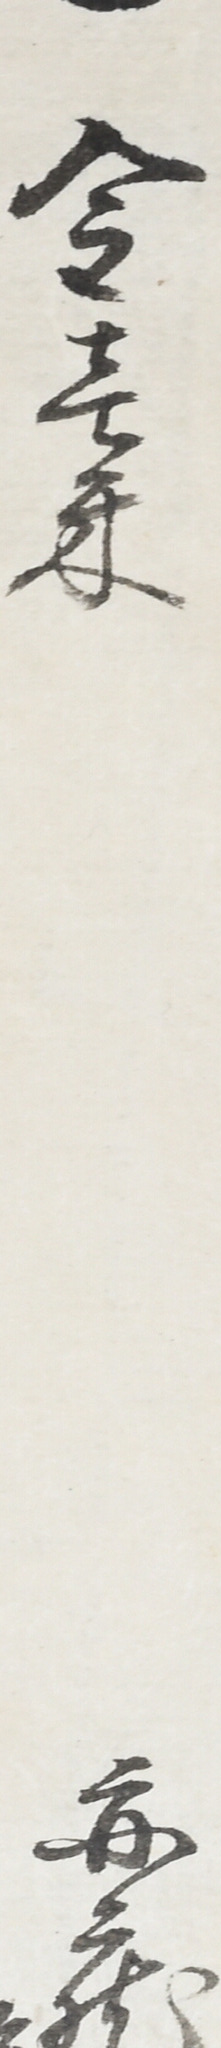一金壱朱亦蔵
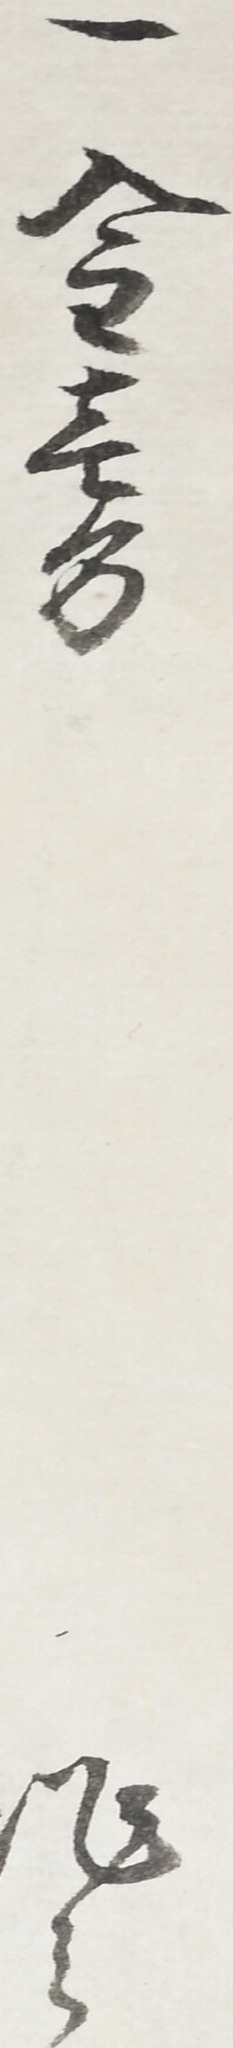一金壱分作之丞
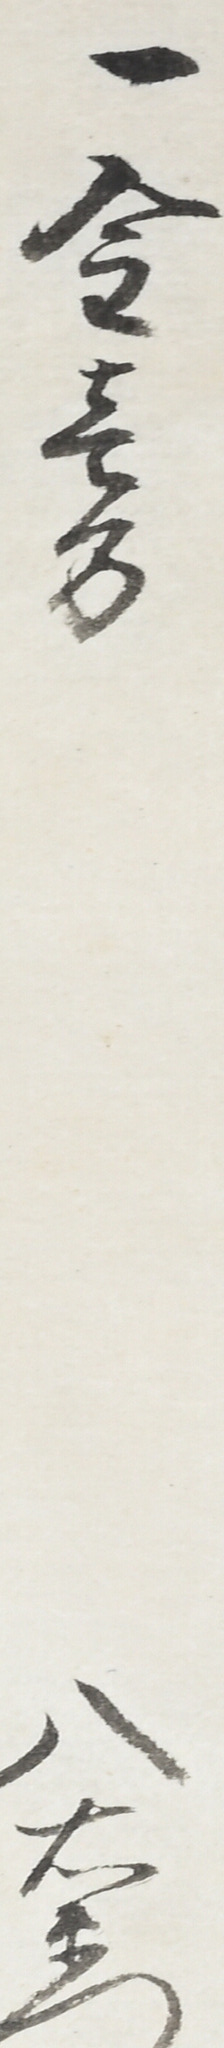一金壱分八右衛門

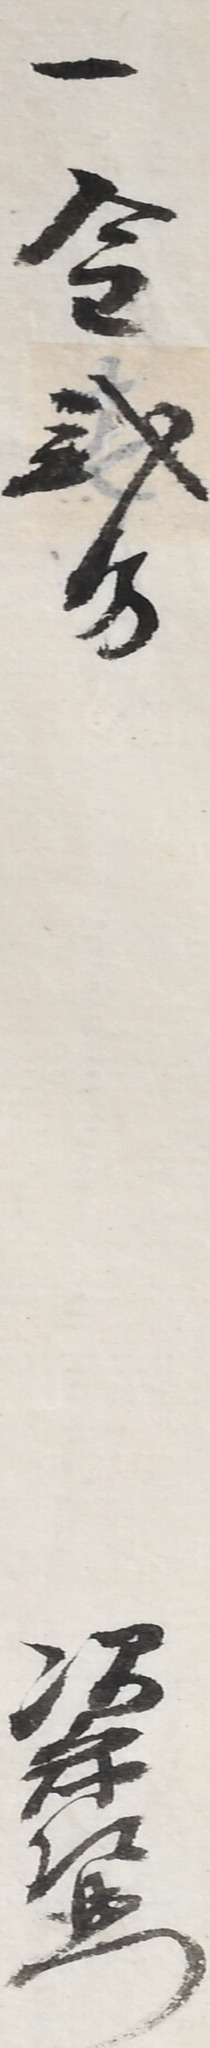一金弐分次郎左衛門
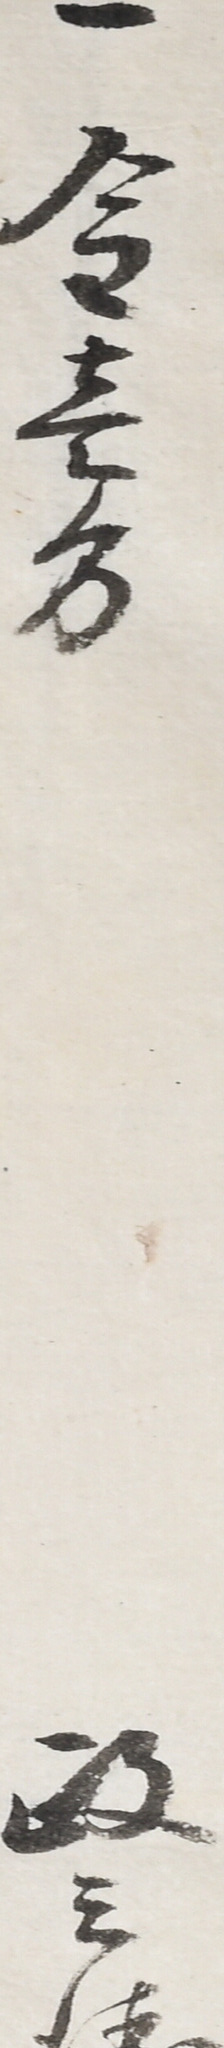一金壱分政兵衛
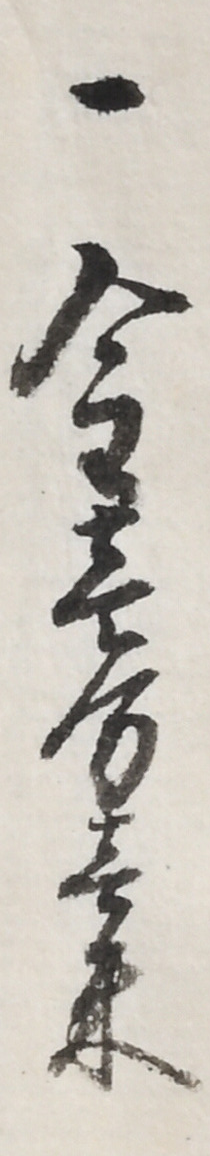一金壱分嘉蔵
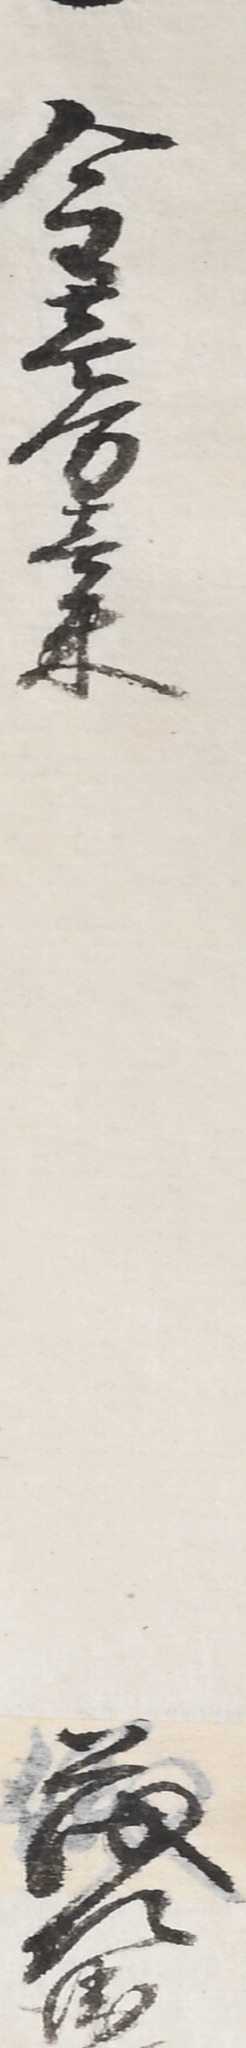一金壱分壱朱茂左衛門
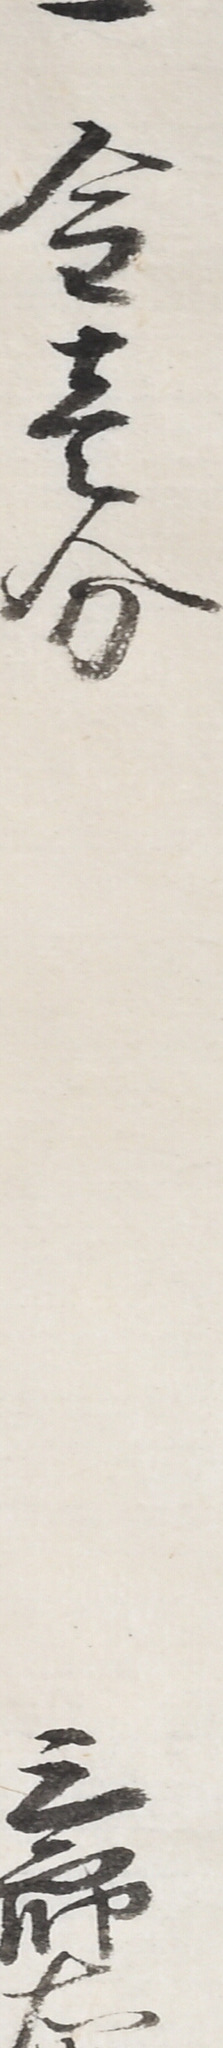一金壱分三郎右衛門
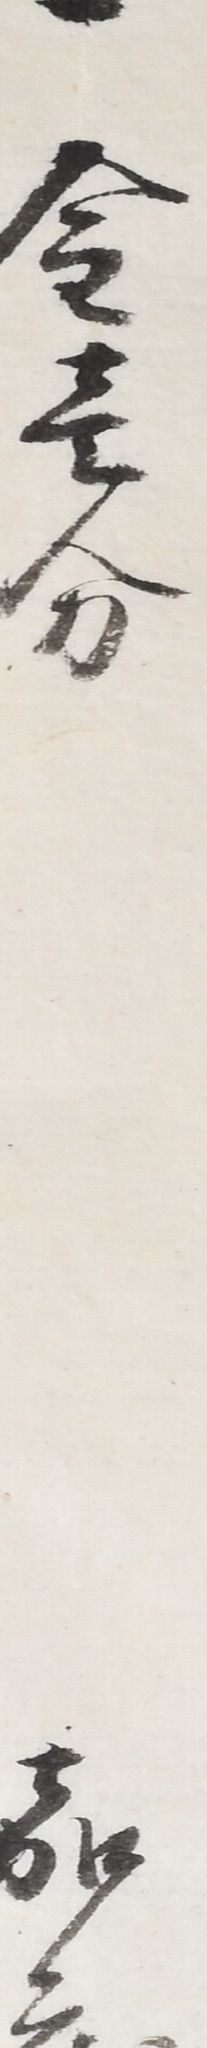一金壱分政兵衛
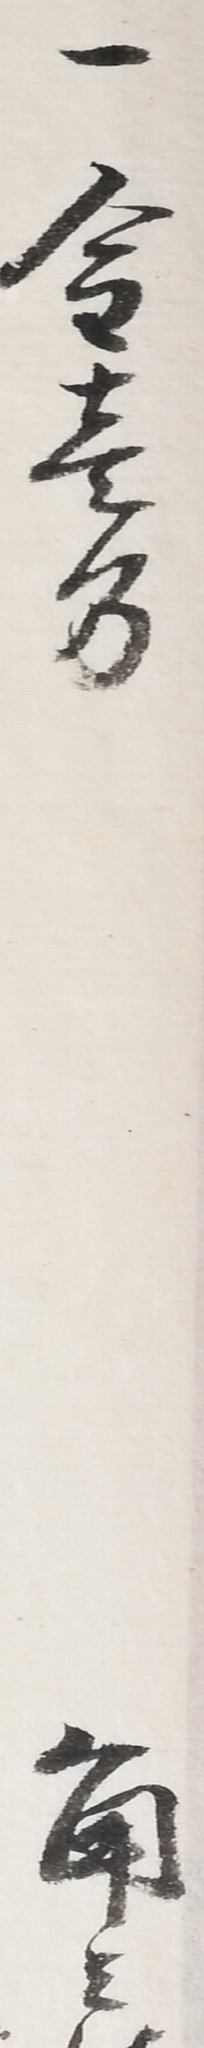一金壱分角兵衛
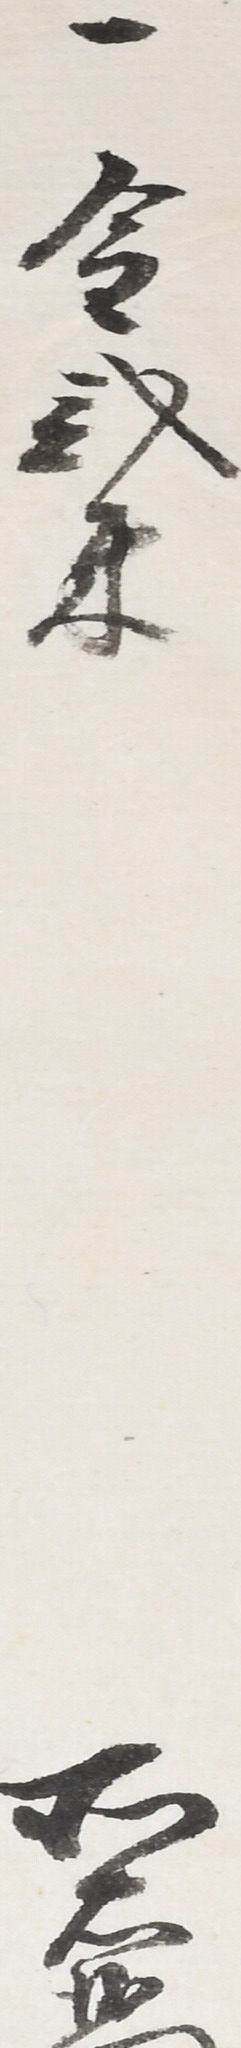一金弐朱所右衛門
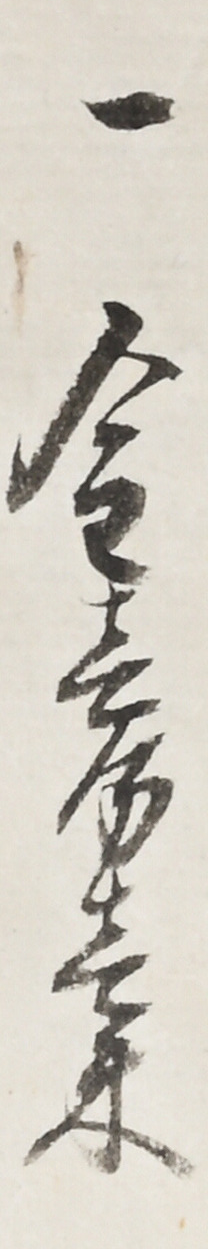一金壱分嘉蔵
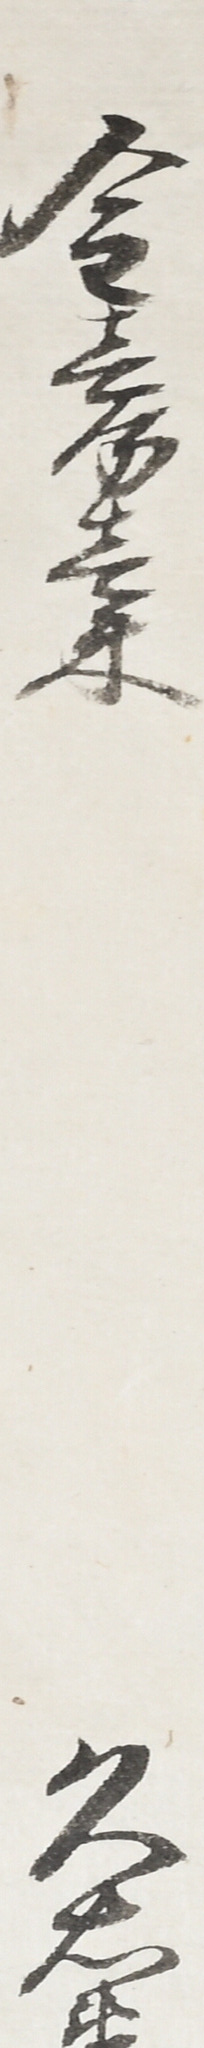一金壱分壱朱久右衛門
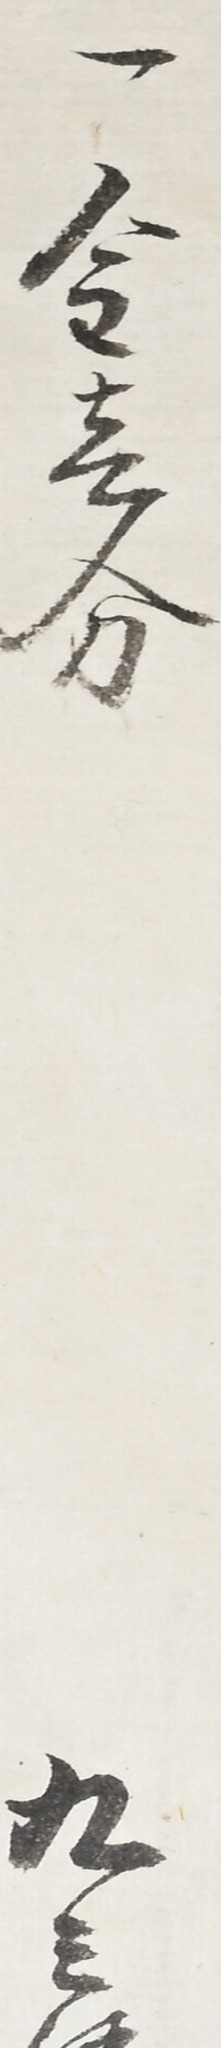一金壱分九兵衛
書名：御拝地百五拾年御祝儀献上御目録名前
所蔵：伊那市立高遠町図書館・合同会社AMANE
